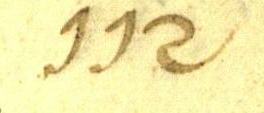112
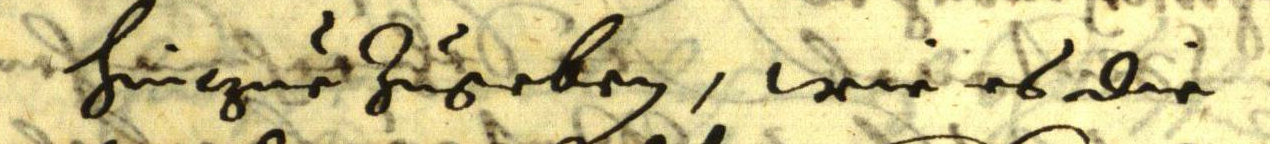hinzūe Zūgeben, wie es die
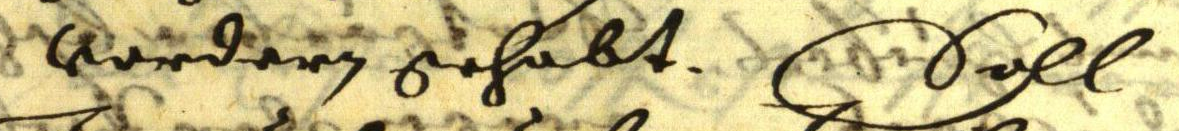vordern gehabt. Soll
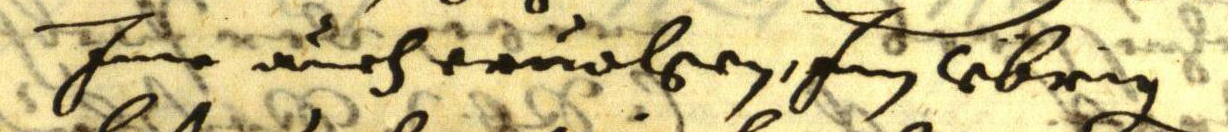Ime aūch erūolgen, Im v̈brig
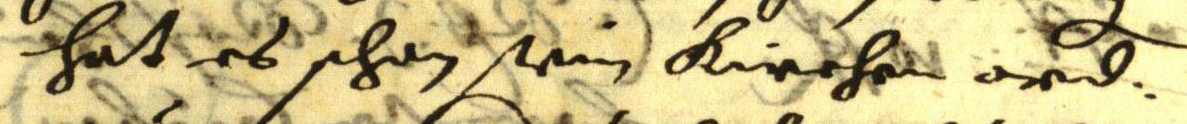hat es schon sein Kirchen ord¬
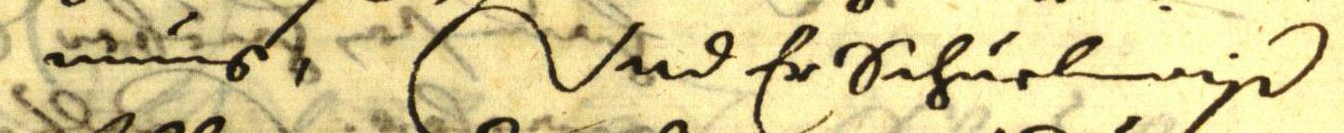nūng, Vnd Er Schūelmaist
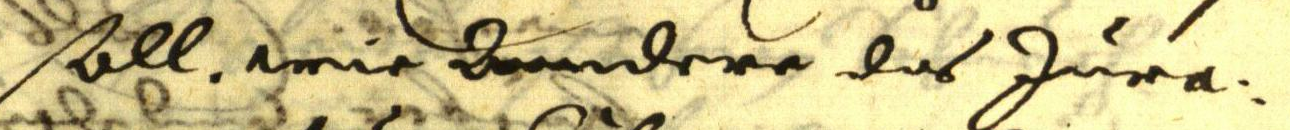soll. wie Anndere das Jūra¬
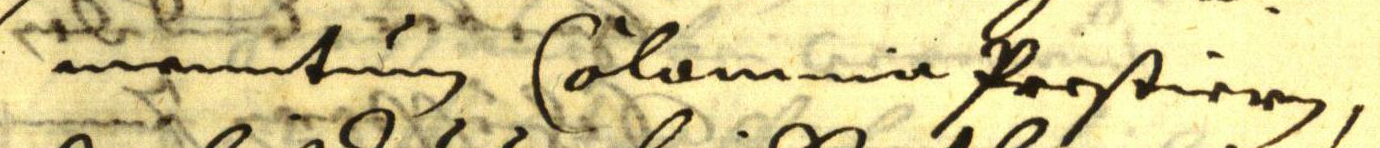mentūm Colamina Prestiern,
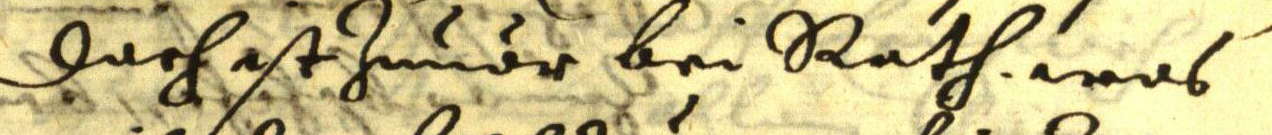doch ist Zūūor bei Rath. was
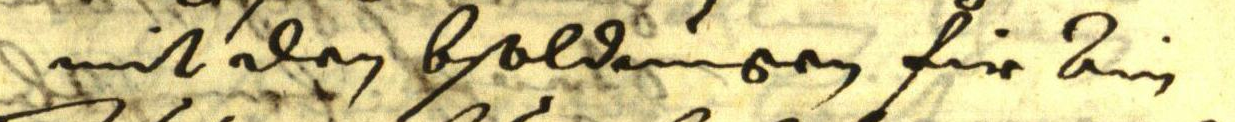mit den bsoldūngen fir Ain
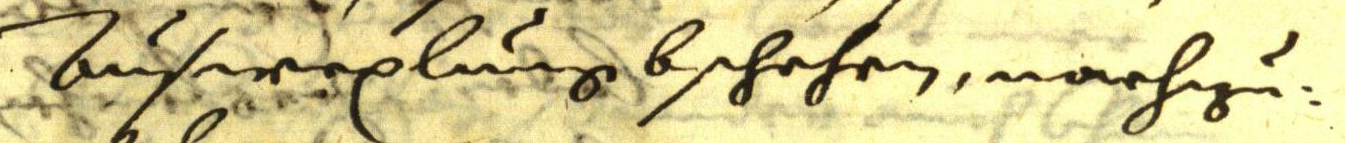Aūswexlūng bschehen, nachzū¬
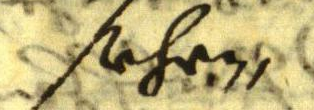sehen,
